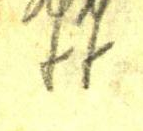77
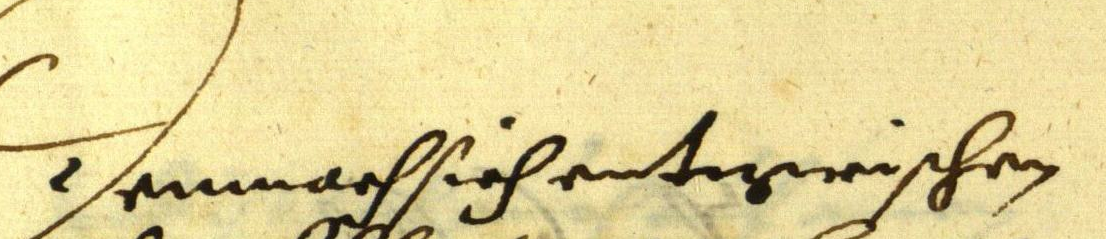Demnach sich entzwischen
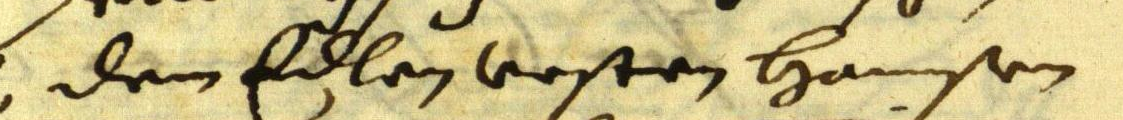dem Edlen vesten Hannsen
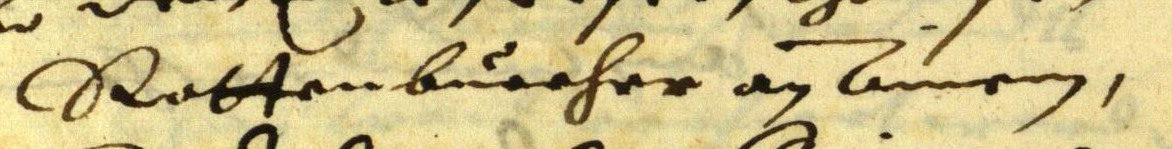Rottenbūecher an Ainem,
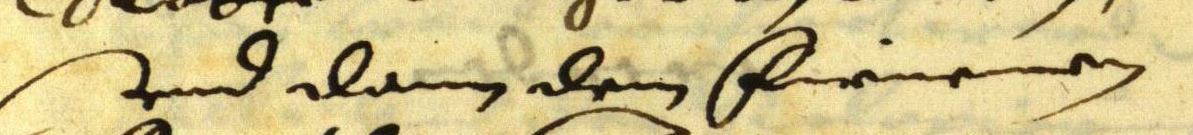vnd dann dem Firnemen
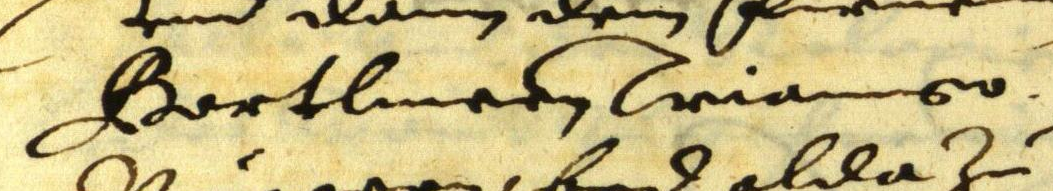Bartlmeen Triango.
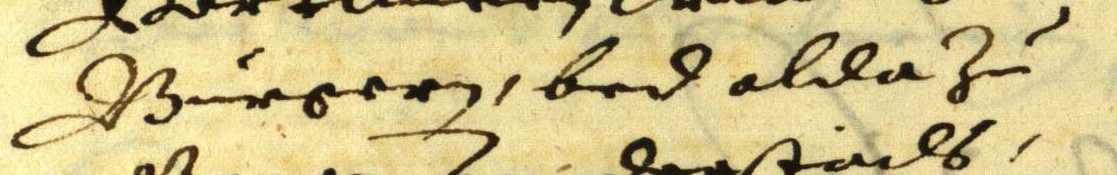Būrgern, bed alda Zū
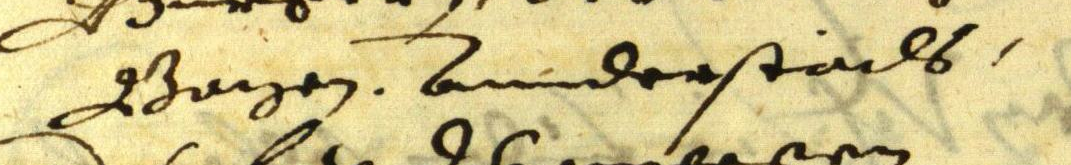Bozen. Annderstails,
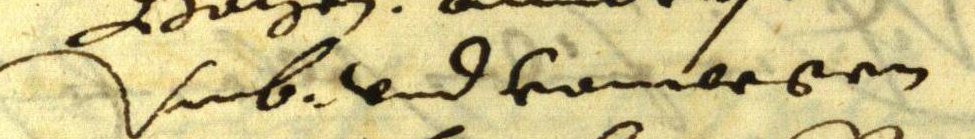Vmb: vnd vonwegen
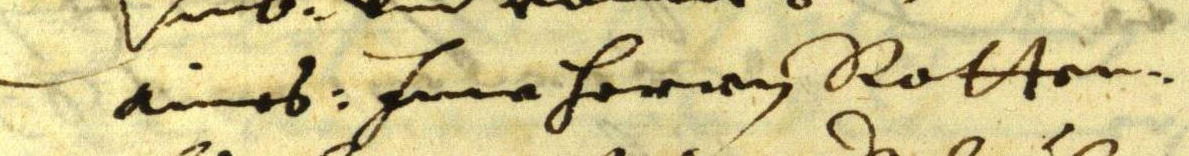aines: Ime herrn Rotten¬
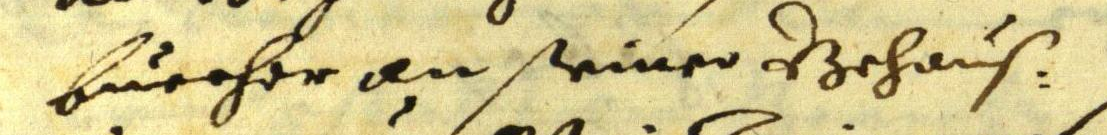būecher an seiner Behaūs¬
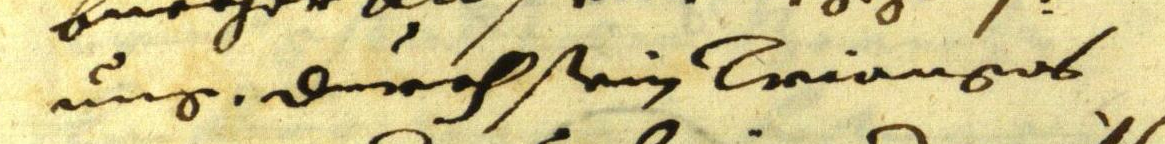ūng. dūrch sein Triangos
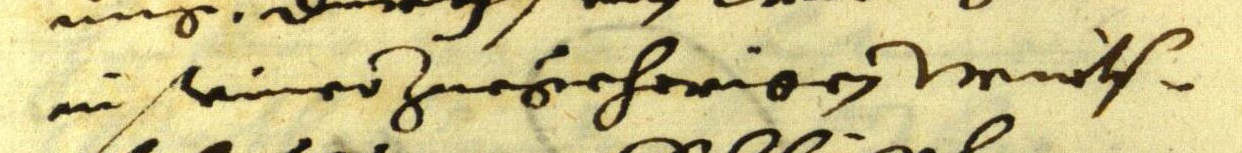in seiner Zūegeherigen Wirts¬
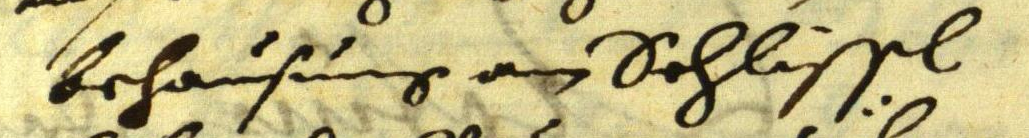behaūsūng am Schlissl
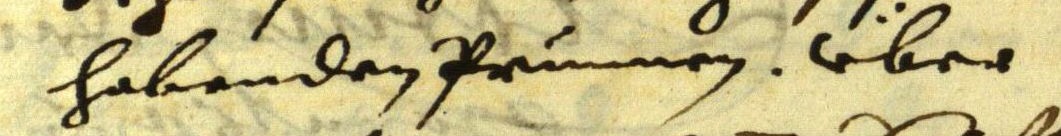habenden Prūnnen. vber
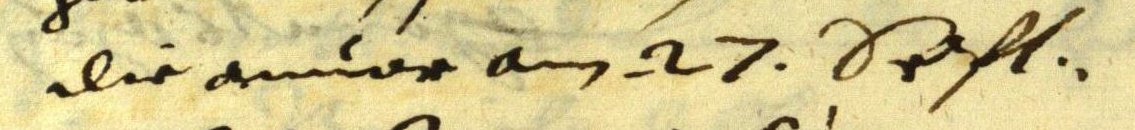die anūor am .27. Sept¬
